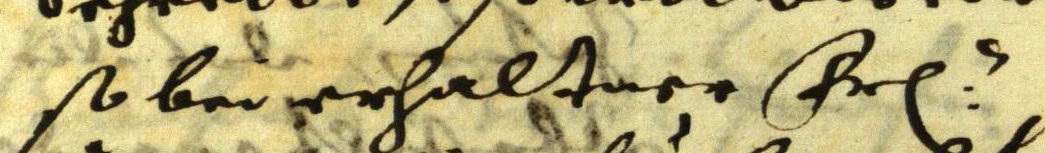So bei erhaltner Frl:
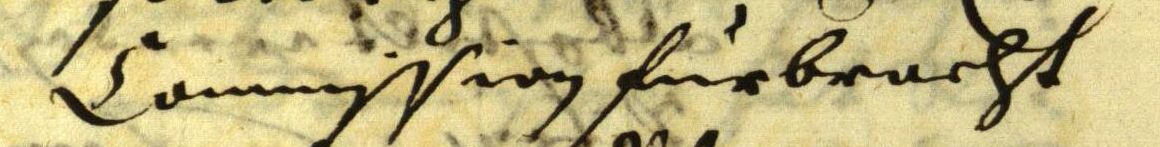Commission fūrbracht
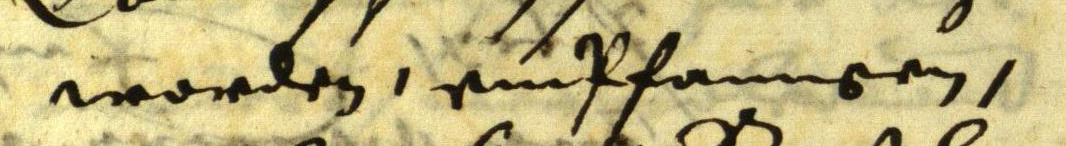worden, empfanngen,
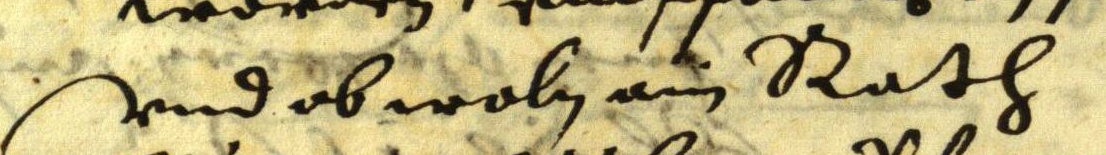vnd ob woln ain Rath
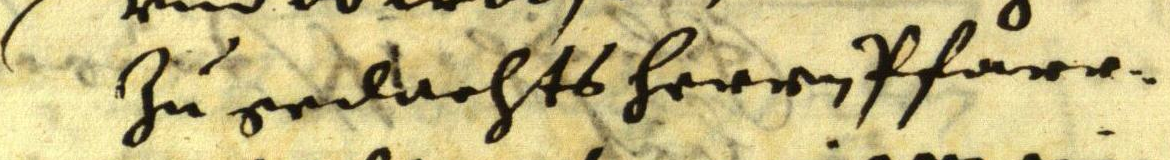Zū gedachts herrn Pfarr¬
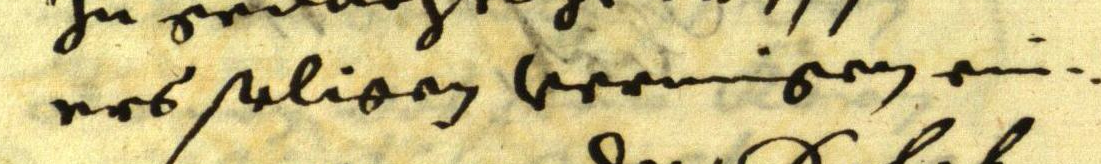ers seligen vermigen ein¬
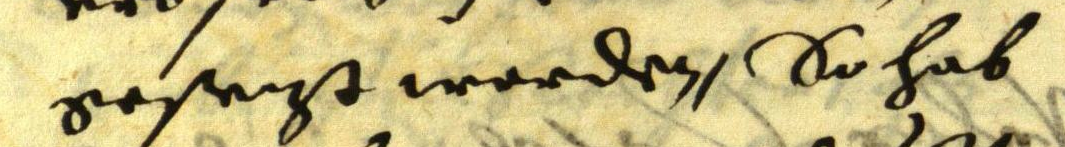gesezt worden, So hab
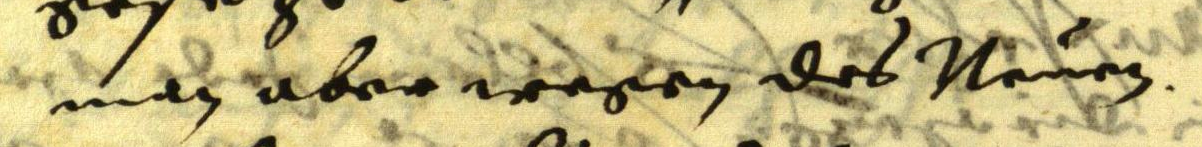man aber wegen des Neūen
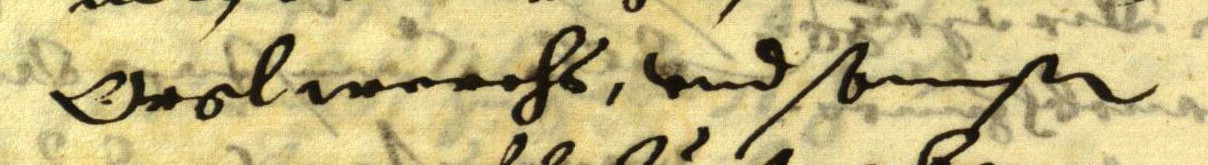Orglwerckhs, vnd sonnsten
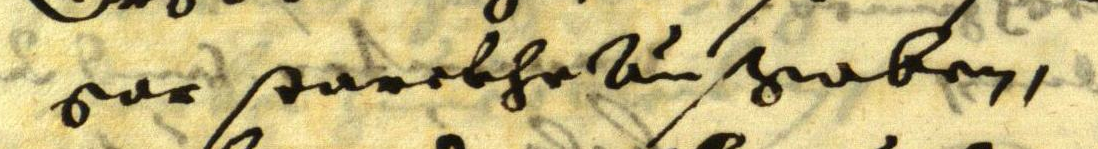gar starckhe Aūsgaben,
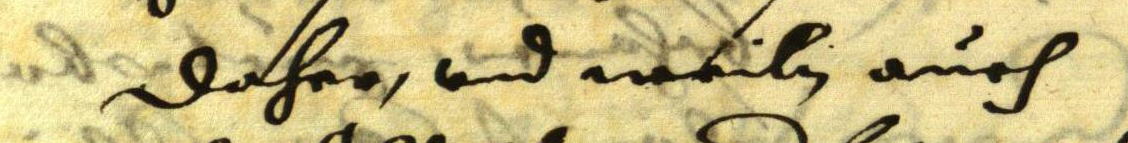daher, vnd weiln aūch
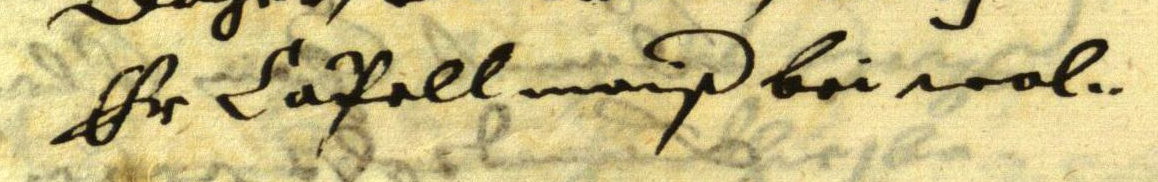Er CaPellmaist bei wol¬
